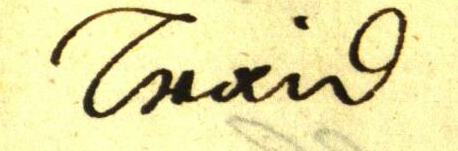Traid
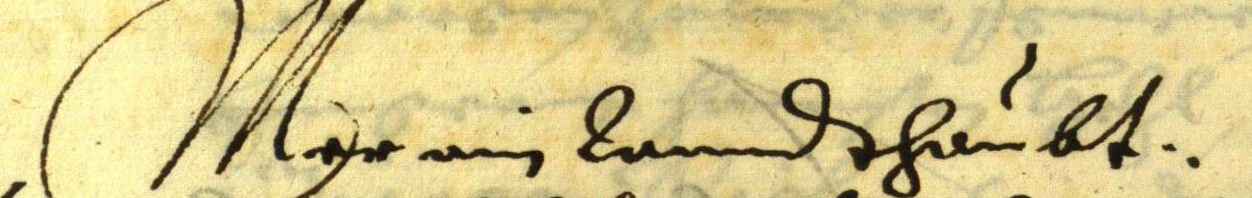Mer ain Lanndthaūbt¬
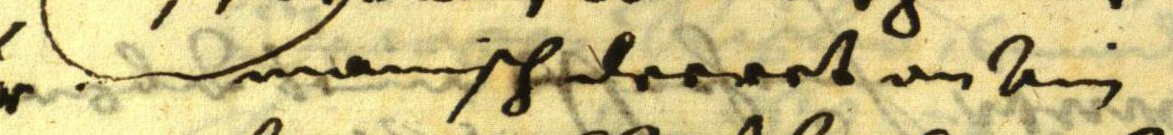manisch decret an Ain
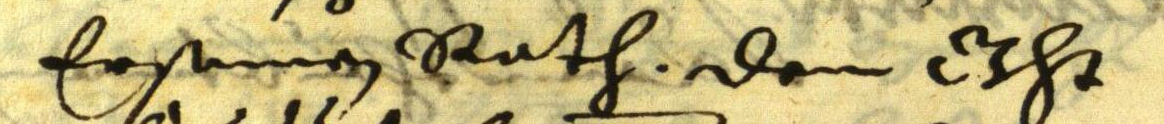Ersamen Rath. dem Ght
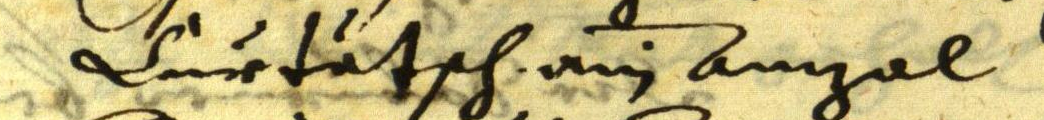Cūrtātsch ain Anzal
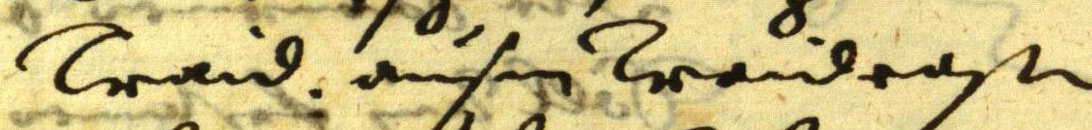Traid. aūsm Traidcast
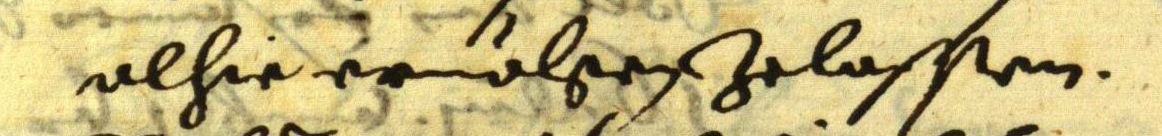alhie erūolgen Zelassen.
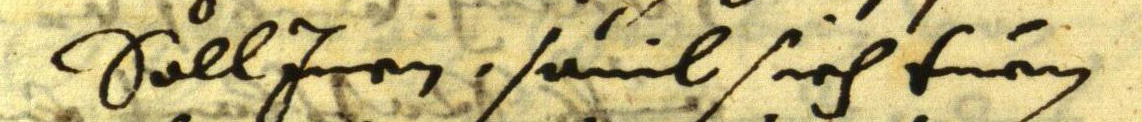Soll Inen. soūil sich tūen
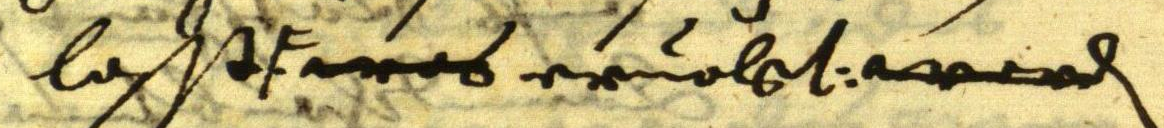lasst was ervolgt: werd
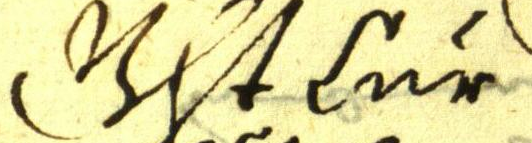Ght Cūr-
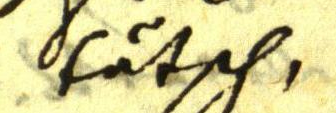tātsch
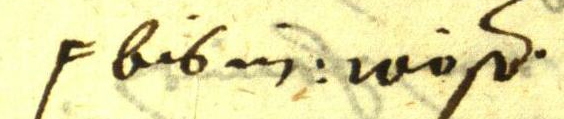bis in: 100 st.
